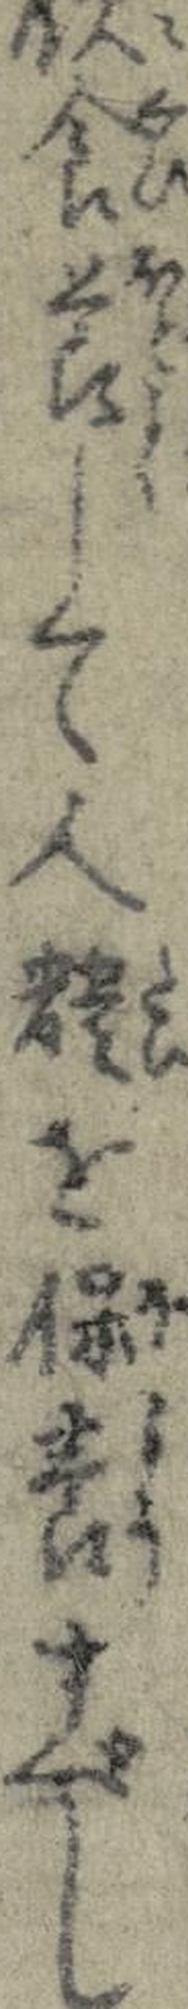飲食節して人體を保養すべし
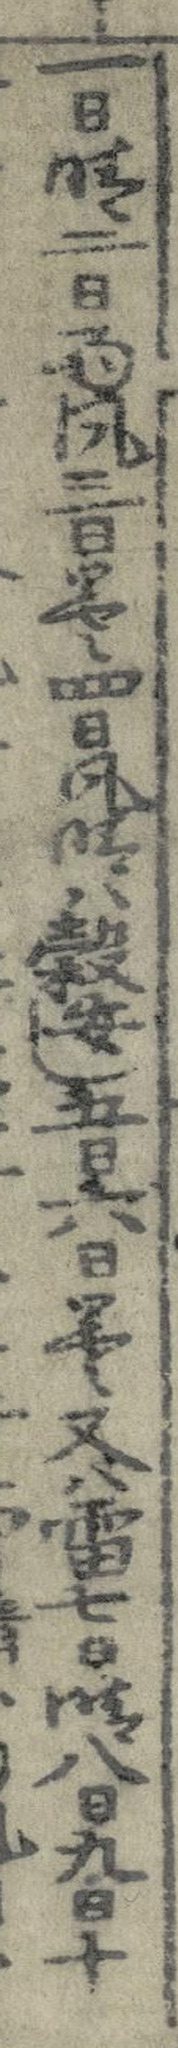一日晴二日雨風三日曇り四日穀安し五日六日曇又は雷七日晴八日九日十
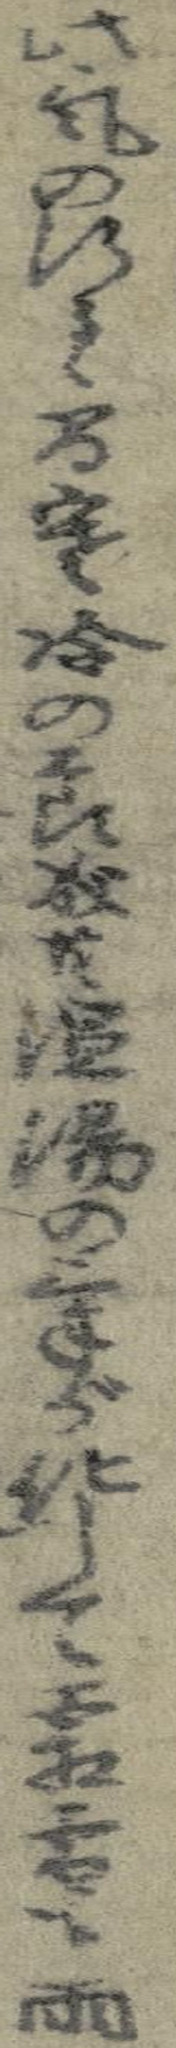此気の行るゝ間寒冷の節成共湿濡の気が化して不相雪也雨
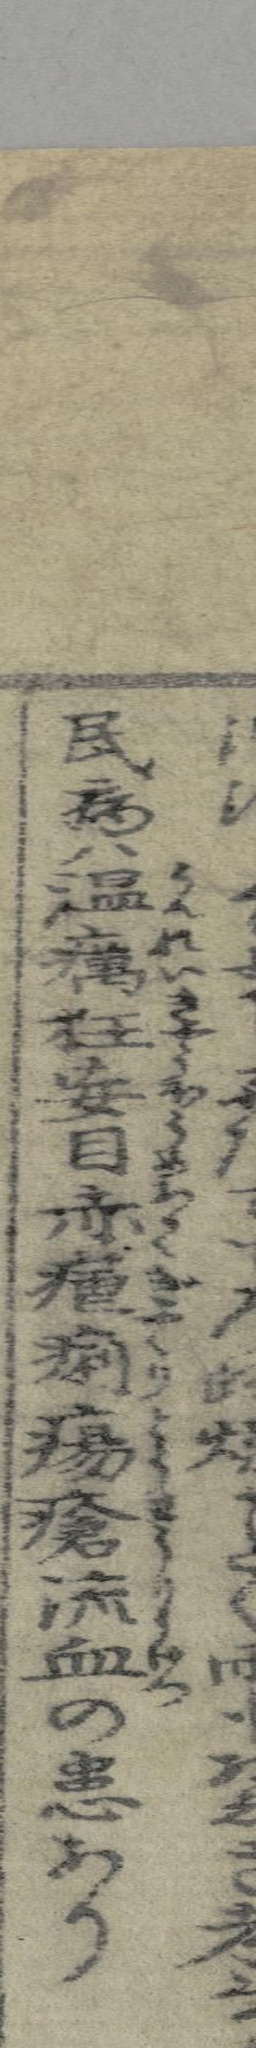民病は温癘狂安目赤瘧痢瘍瘡流血の患あり
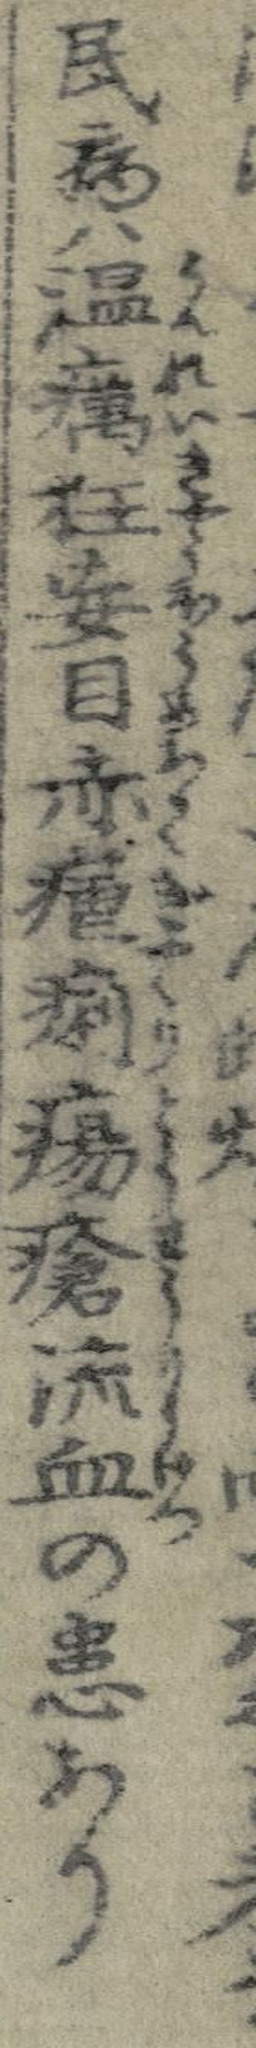民病は温癘狂安目赤瘧痢瘍瘡流血の患あり
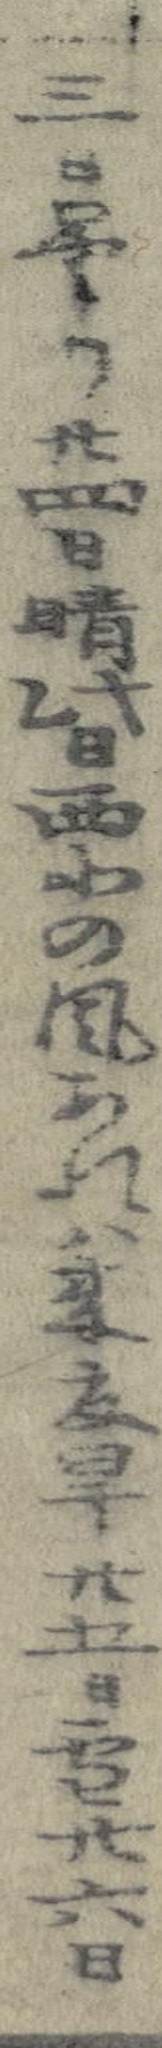三日曇り廿四日晴此日西北の風あれは来麦早廿五日雪廿六日
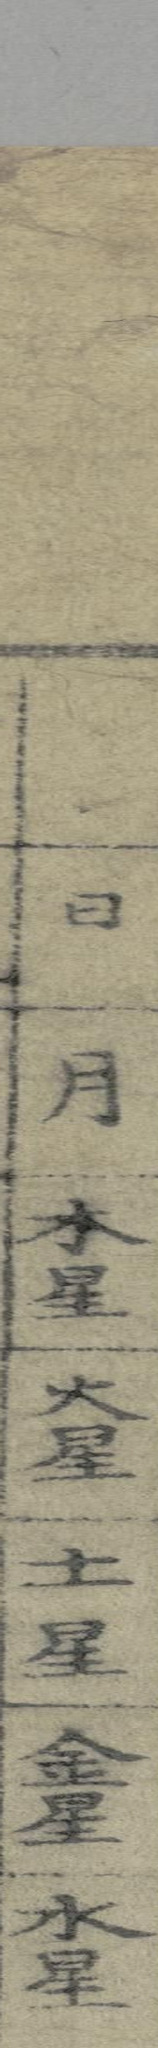日月木星火星土星金星水星
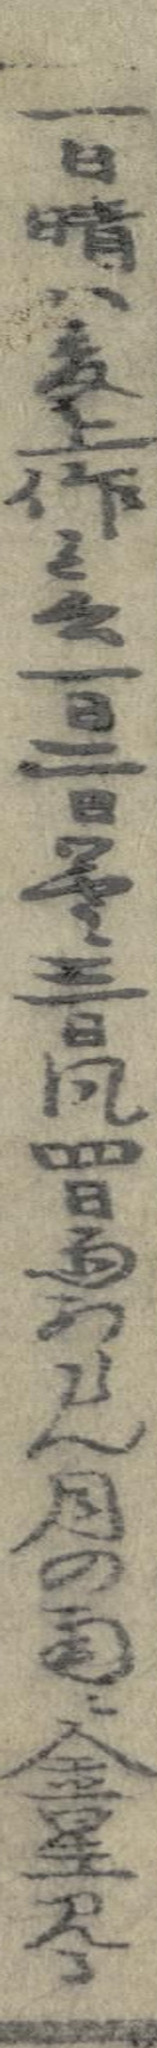一日晴は麦上作と云一日二日曇三日風四日雨あらん月の南に金星見る
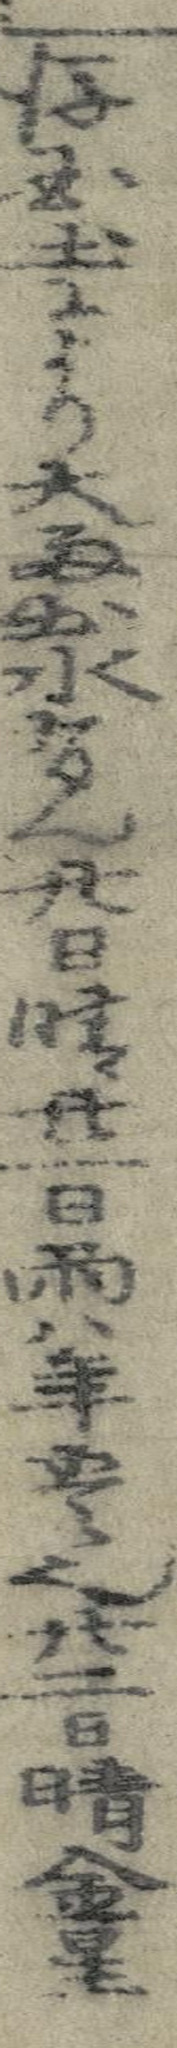後国土により大雨出水有也廿日晴廿一日雨は年豊也廿二日晴金星
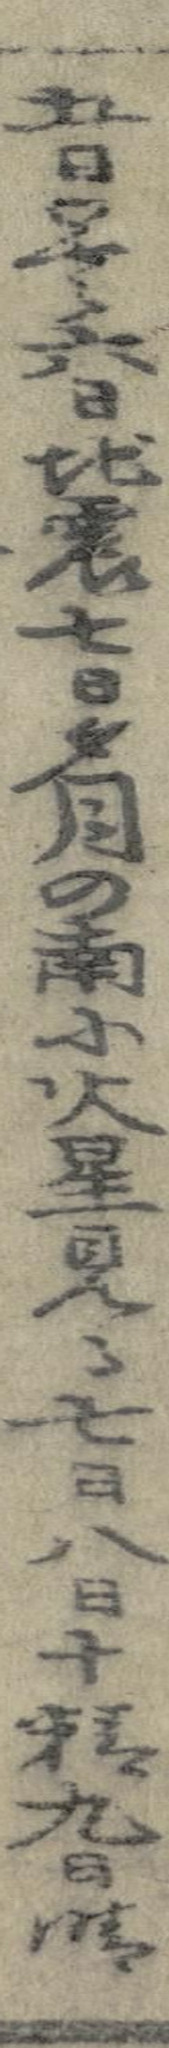五日曇六日地震七日夕月の南に火星見る七日八日十精九日晴
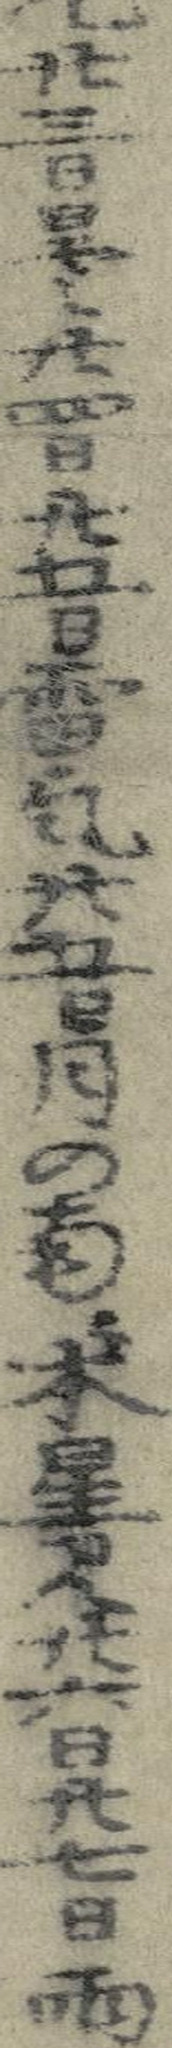夕見廿三日曇り廿四日廿五日雷気廿五日月の南に木星見廿六日廿七日雨
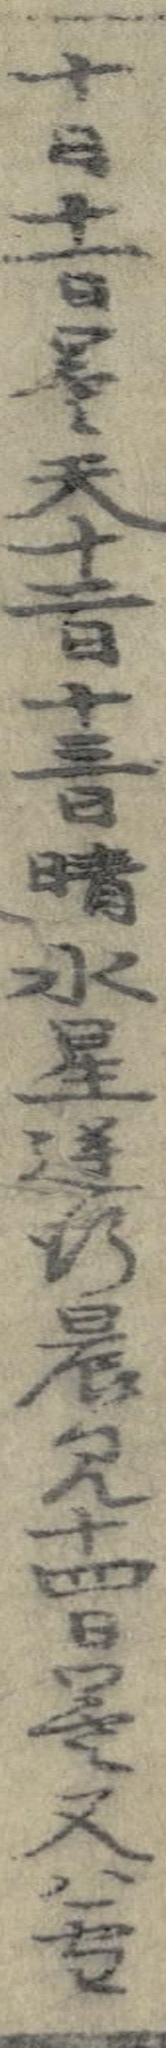十日十一日曇天十二日十三日晴水星逆行晨見十四日曇又は雪
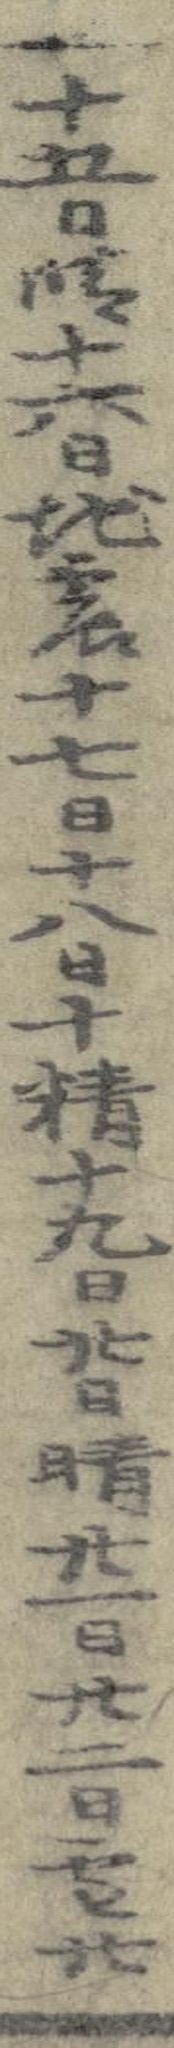十五日晴十六日地震十七日十八日十精十九日廿日晴廿一日廿ニ日雪廿
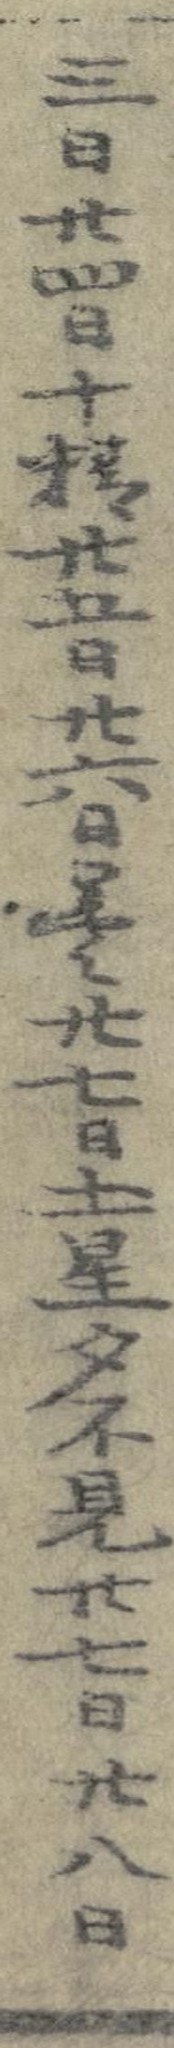三日廿四日十精廿五日廿六日曇廿七日土星夕不見廿七日廿八日
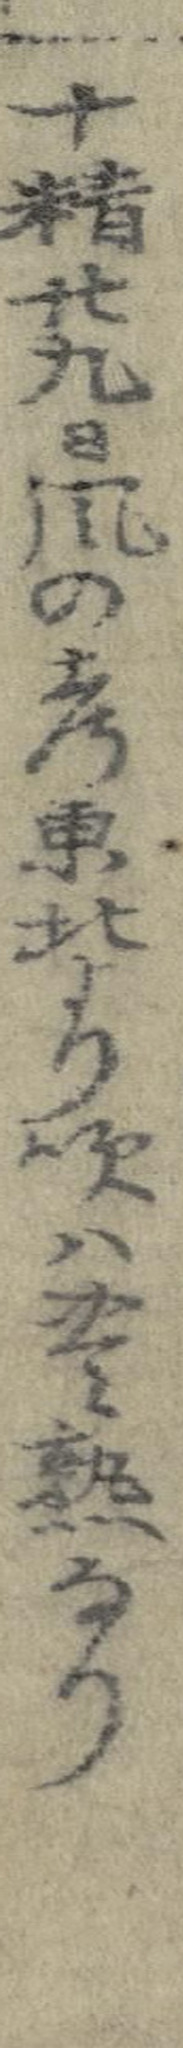十精廿九日風の考東北より吹は炎熱なり
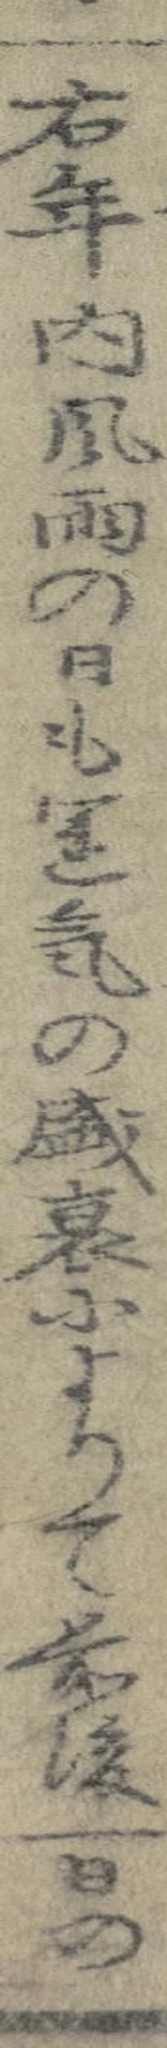右年内風雨の日も運気の盛衰によりて前後一日の
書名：天保十六年乙巳七曜　晴雨考　土御門殿御免
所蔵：東京大学地震研究所図書室 Earthquake Research Institute Library, The University of Tokyo, JAPAN
